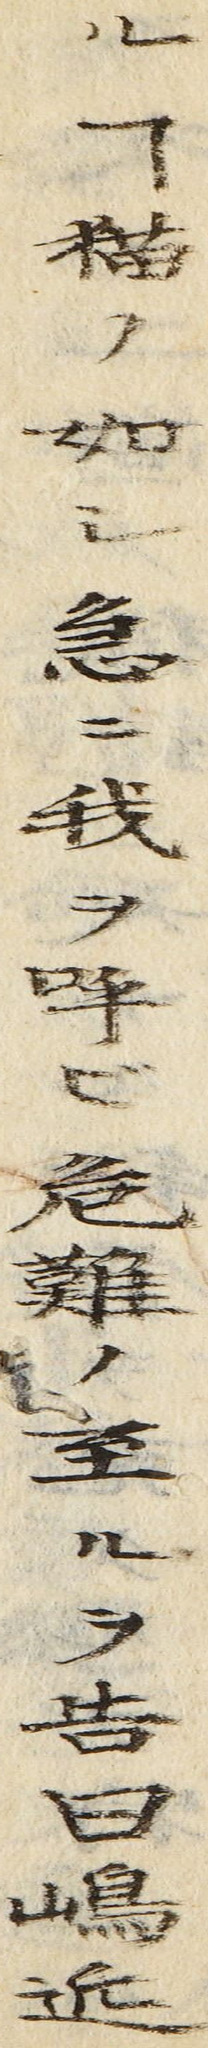ルコト猫ノ如シ急ニ我ヲ呼ビ危難ノ至ルヲ告曰嶋近
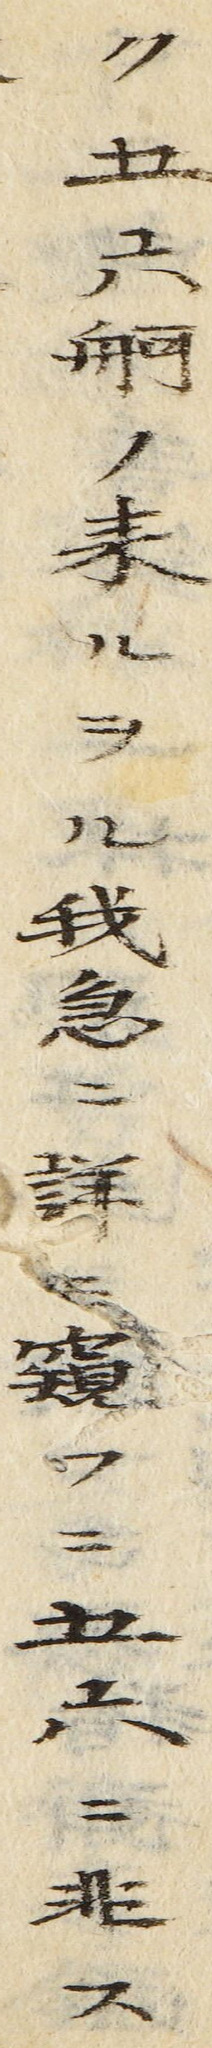ク五六舸ノ来ルヲル我急ニ詳ニ窺フニ五六ニ非ス
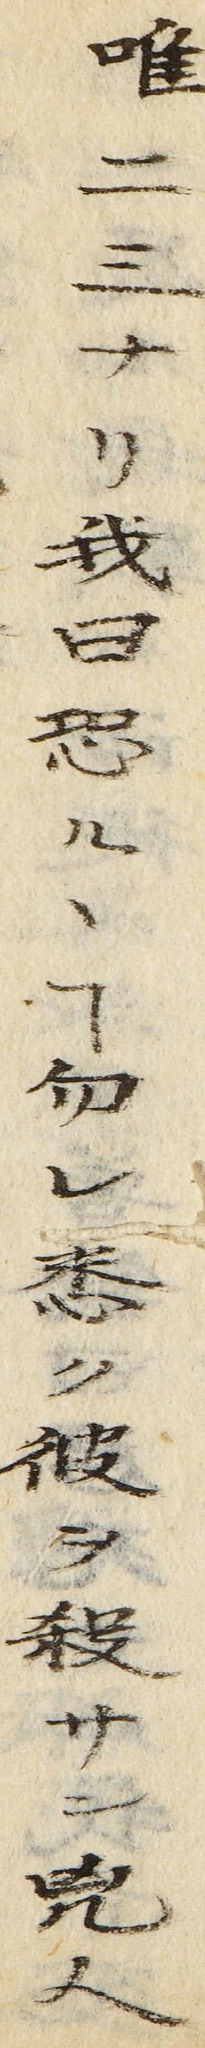唯二三ナリ我曰恐ルヽコト勿レ悉ク彼ヲ殺サン兇人
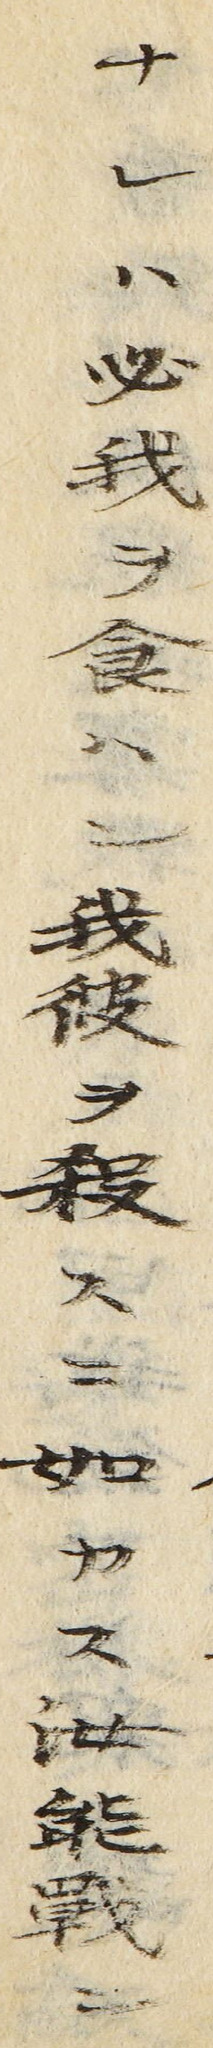ナレハ必我ヲ食ハン我彼ヲ殺スニ如カス汝能戦ン

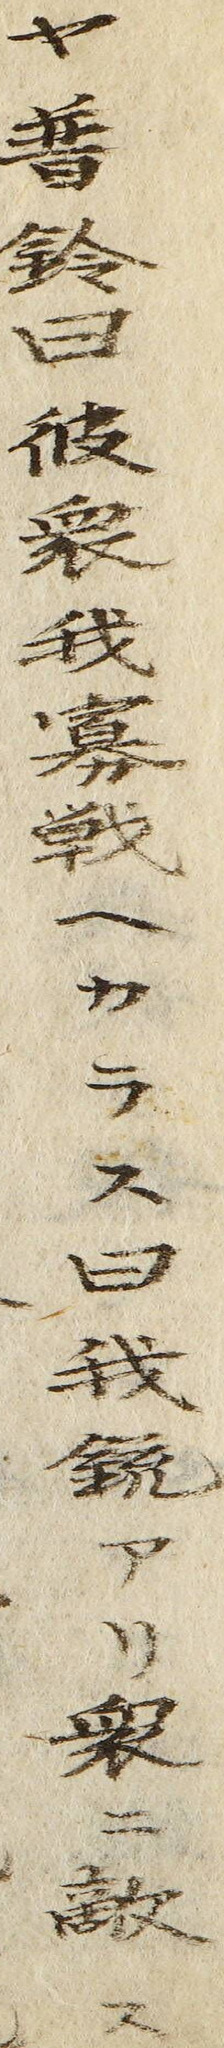ヤ普鈴曰彼衆我寡戦ヘカラス曰我銃アリ衆ニ敵ス
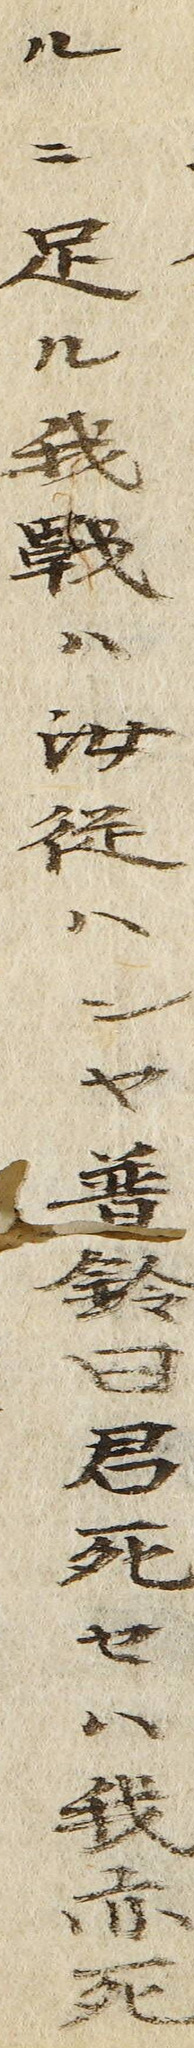ルニ足ル我戦ハ汝従ハンヤ普鈴曰君死セハ我亦死
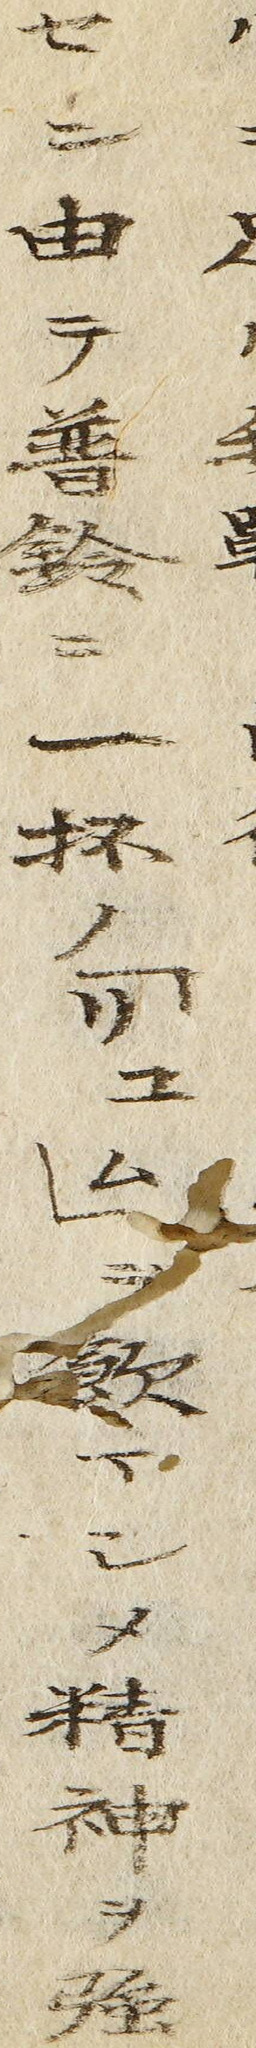セン由テ普鈴ニ一杯ノ「リュム」ヲ飲マシメ精神ヲ強
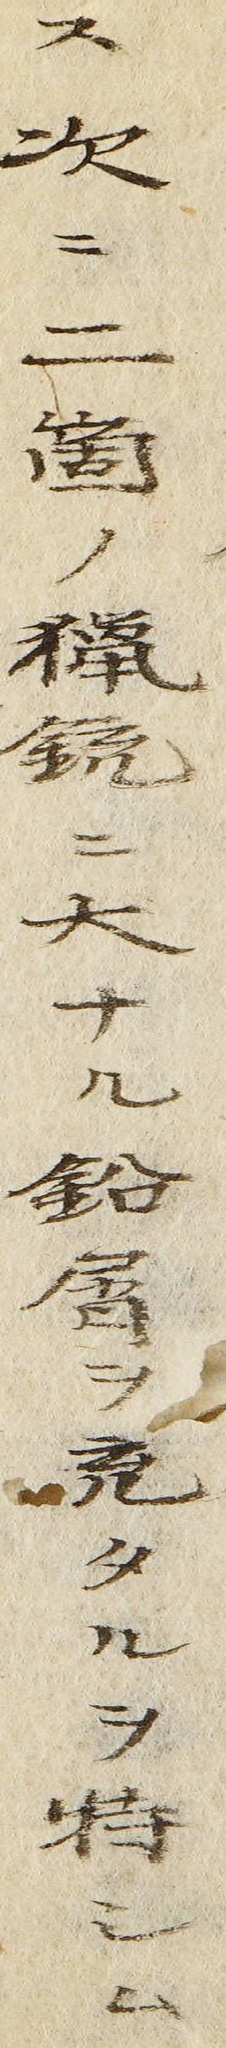ス次ニ二箇ノ猟銃ニ大ナル鉛屑ヲ充タルヲ特シム
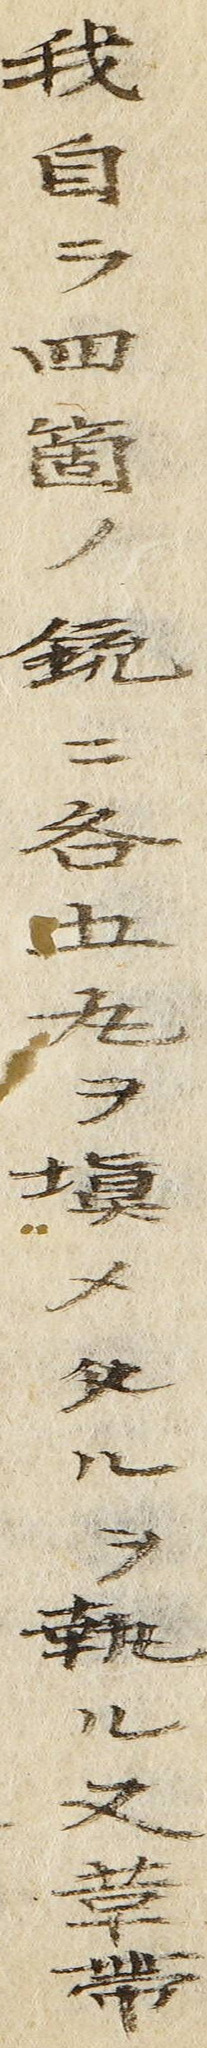我自ラ四箇ノ銃ニ各五丸ヲ填メタルヲ執ル又革帯
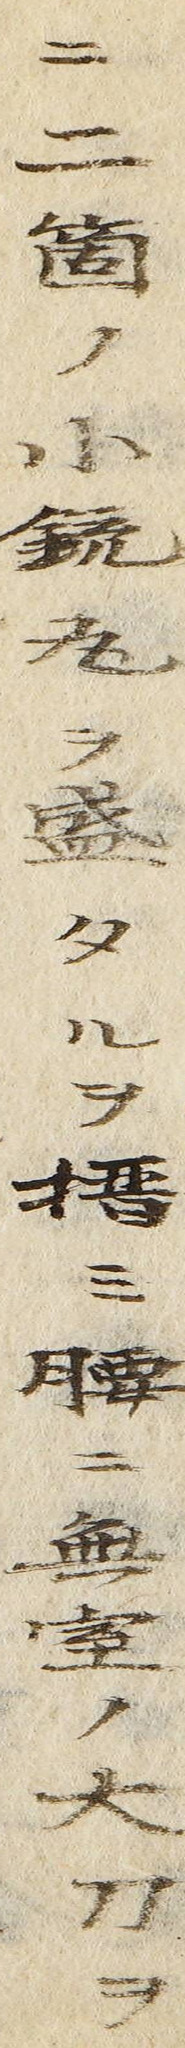ニ二箇ノ小銃丸ヲ盛タルヲ搢ミ腰ニ無室ノ大刀ヲ
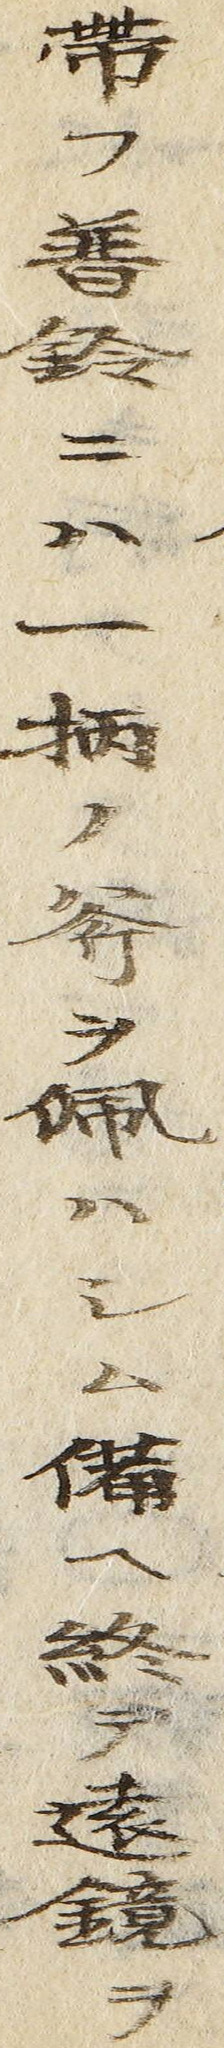帯フ普鈴ニハ一柄ノ斧ヲ佩ハシム備ヘ終デ遠鏡ヲ
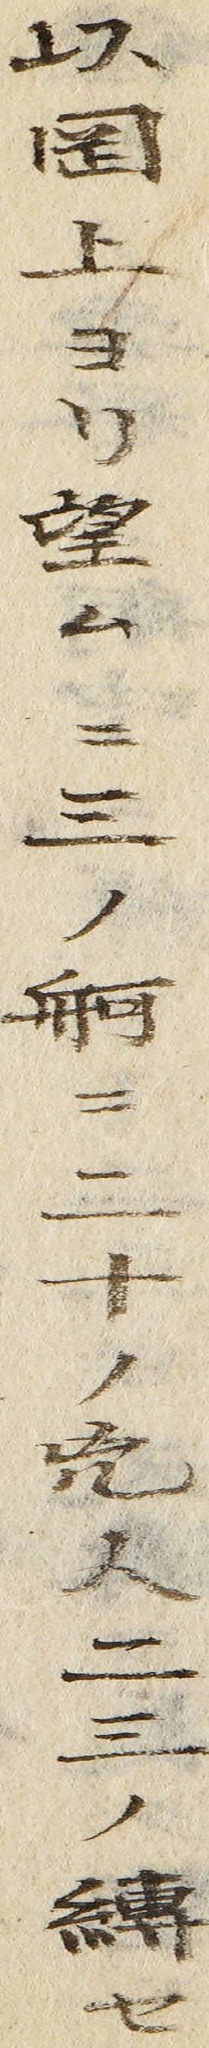以岡上ヨリ望ムニ三ノ舸ニ二十ノ兇人二三ノ縛セ
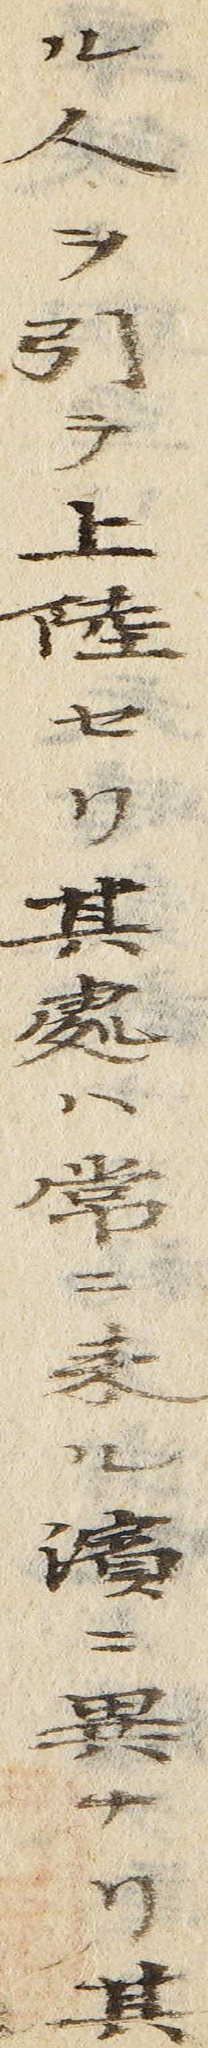ル人ヲ引テ上陸セリ其処ハ常ニ来ル浜ニ異ナリ其
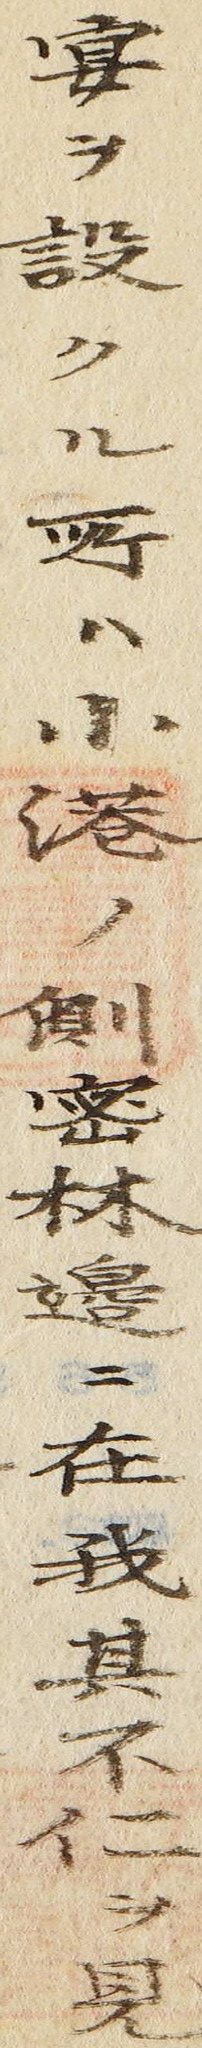宴ヲ設クル所ハ小港ノ側密林辺ニ在我其不仁ヲ見
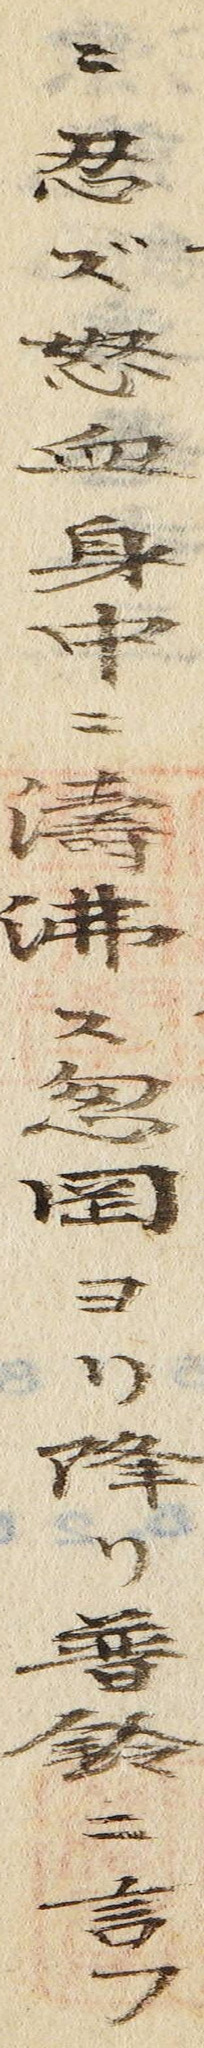ニ忍ズ怒血身中ニ濤沸ス忽岡ヨリ降リ普鈴ニ言フ
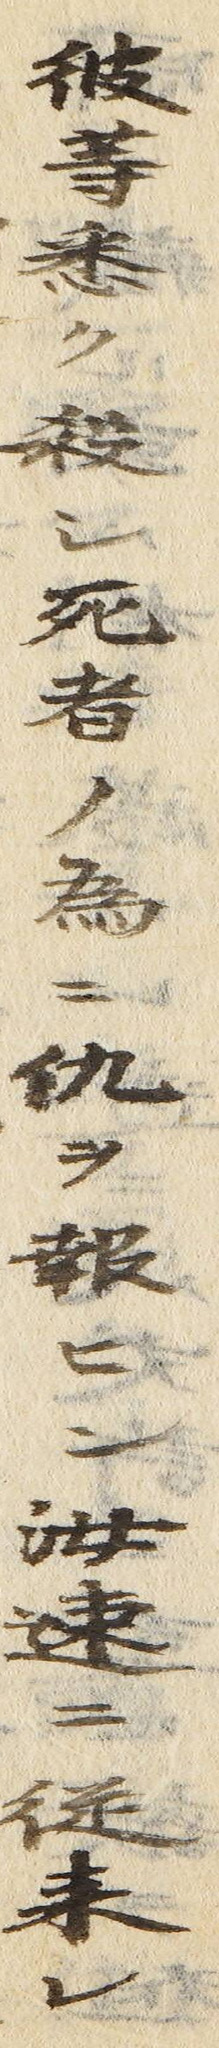彼等悉ク殺シ死者ノ為ニ仇ヲ報ヒン汝速ニ従来レ
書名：漂流紀事
